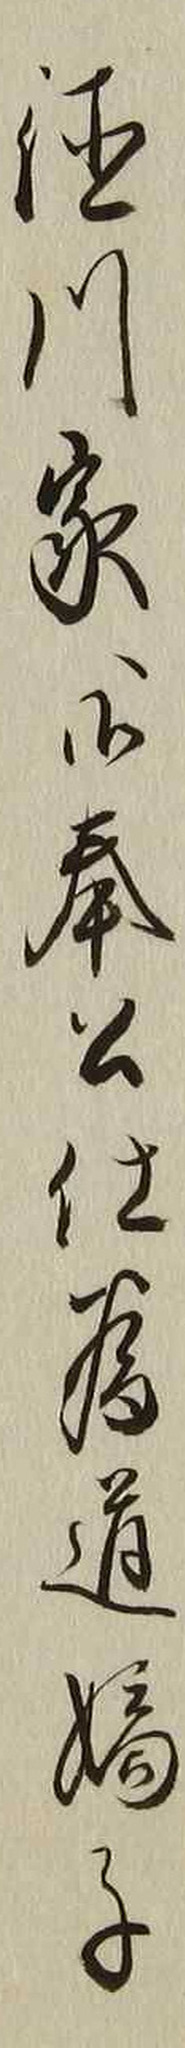徳川家へ御奉公仕為道嫡子
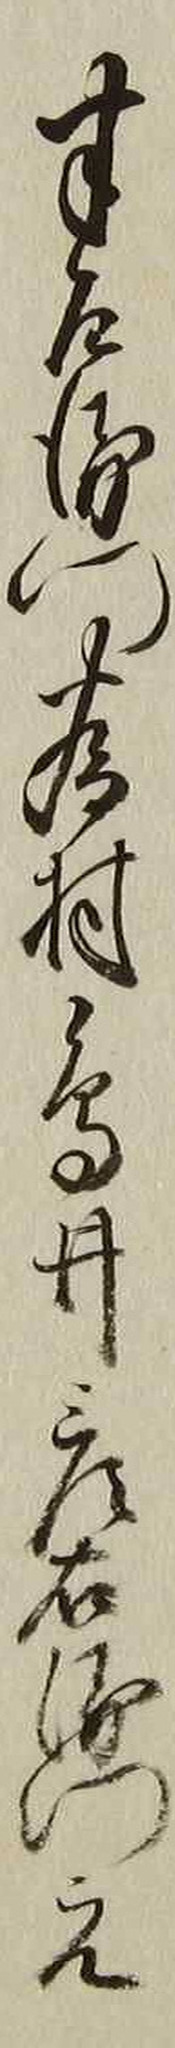半左衛門為村鳥井彦右衛門元
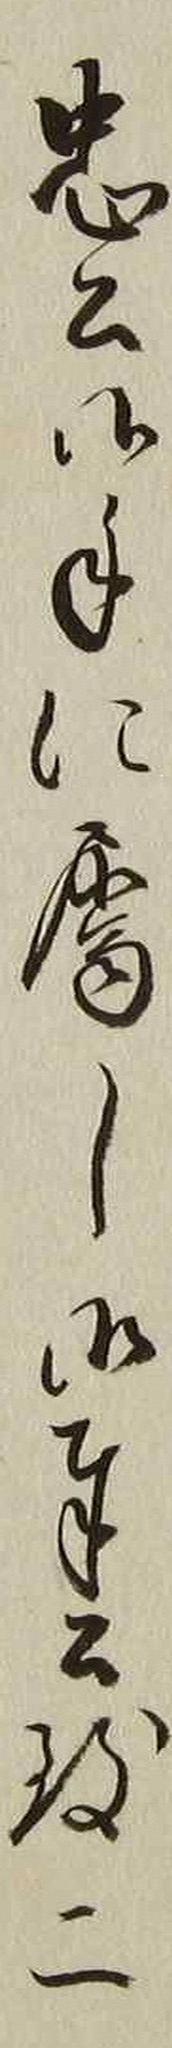忠公御手に属し御奉公致二
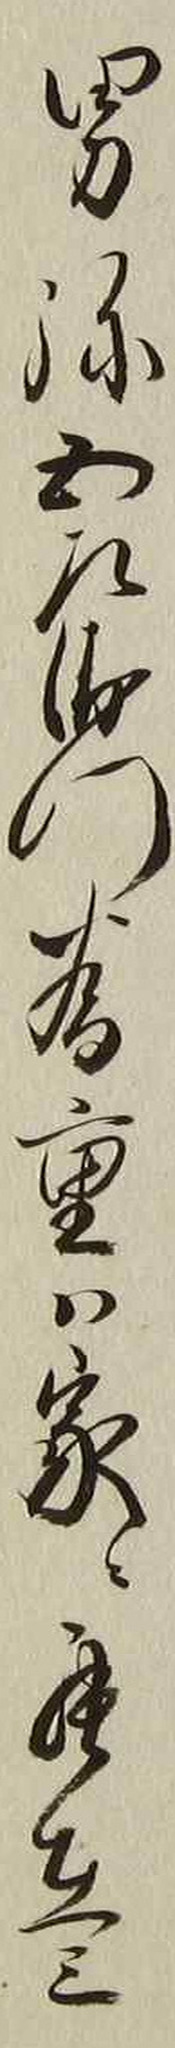男弥五左衛門為重ハ家に罷在三
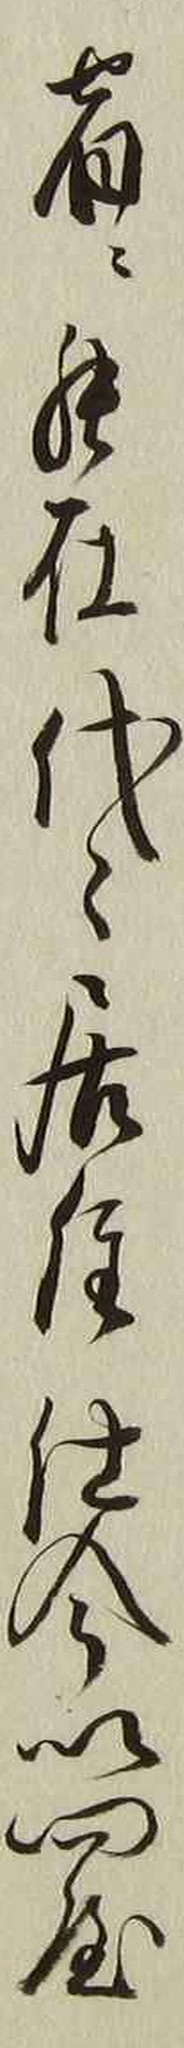宿ニ罷在代々居住仕今以問屋
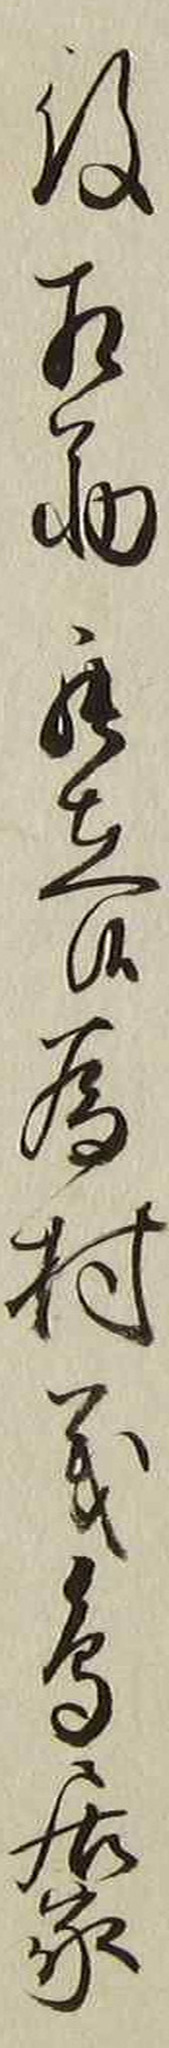致相勤罷在候為村義鳥居家
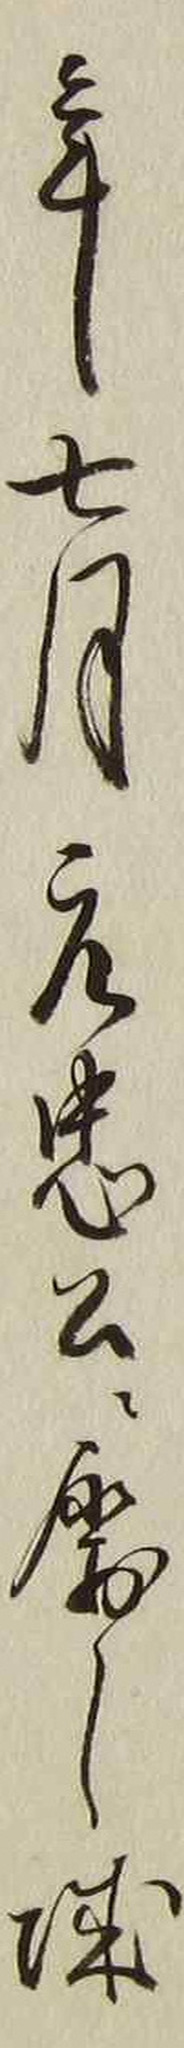年七月元忠公ニ属し城
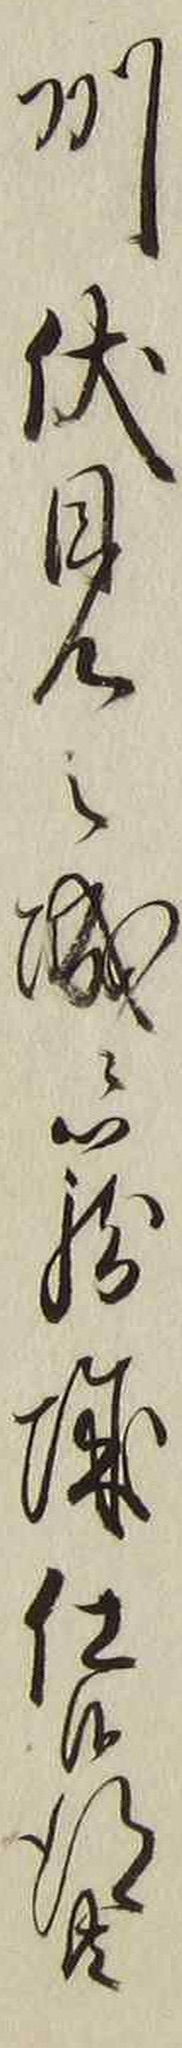州伏見之城ニ籠城仕候得共
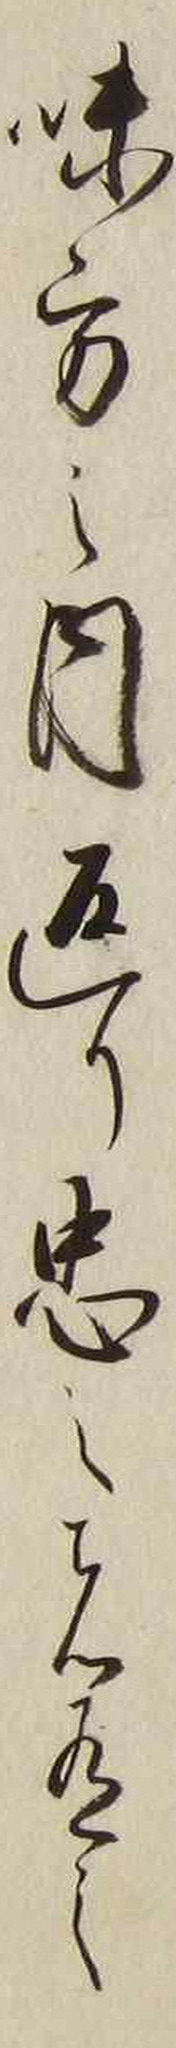味方之内返り忠之者有之

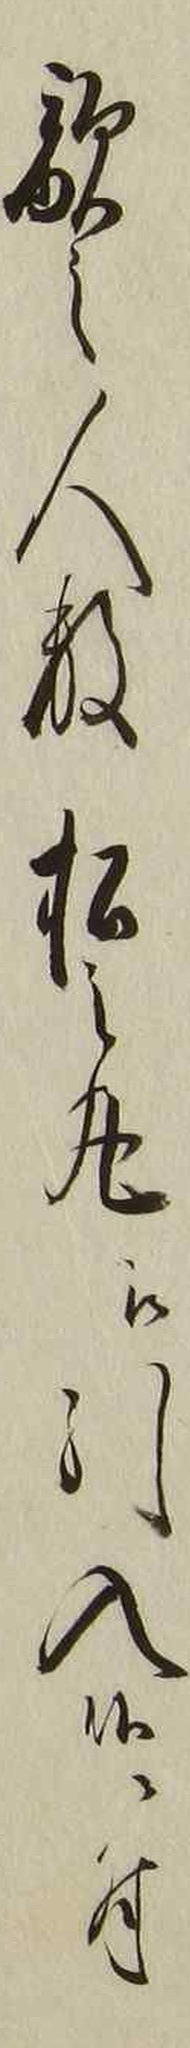敵之人数松之丸江引入候ニ付
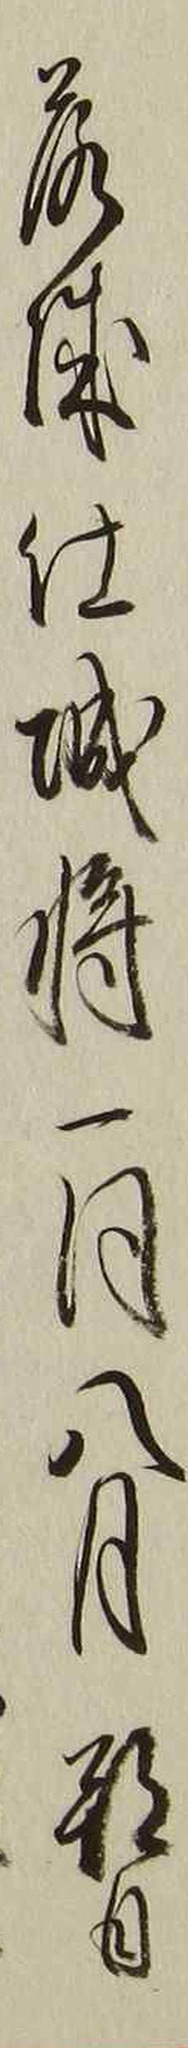落城仕城将一同八月朔日
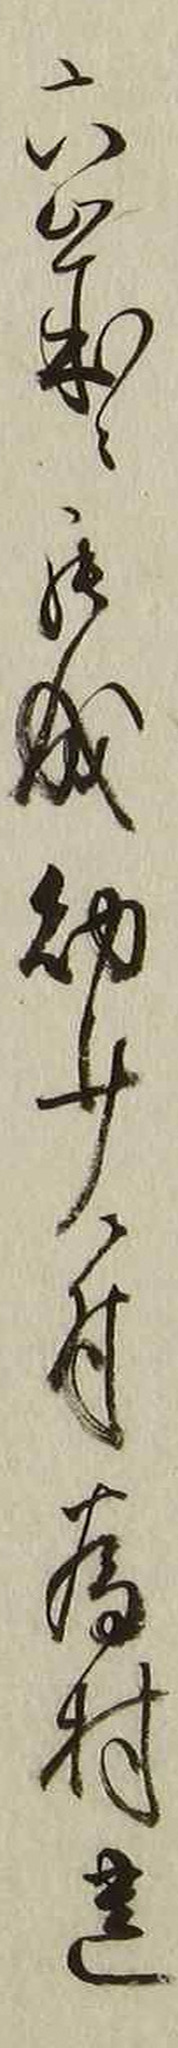六歳ニ罷成幼少ニ付為村遺
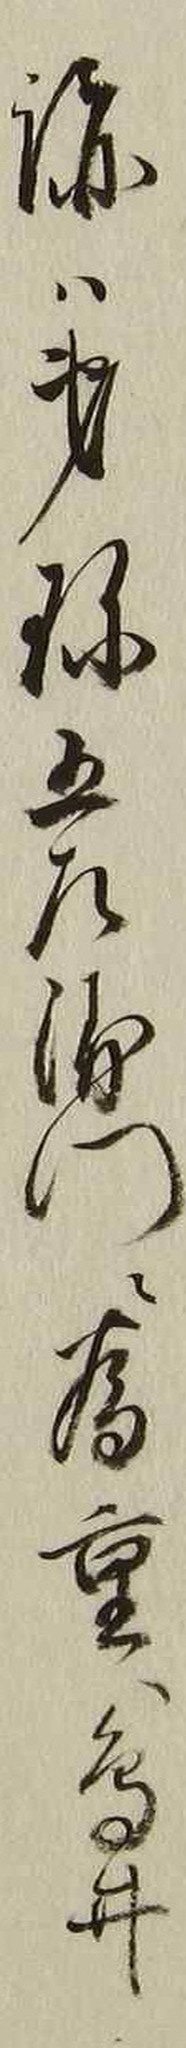跡は弟弥五左衛門ニ為重へ鳥井
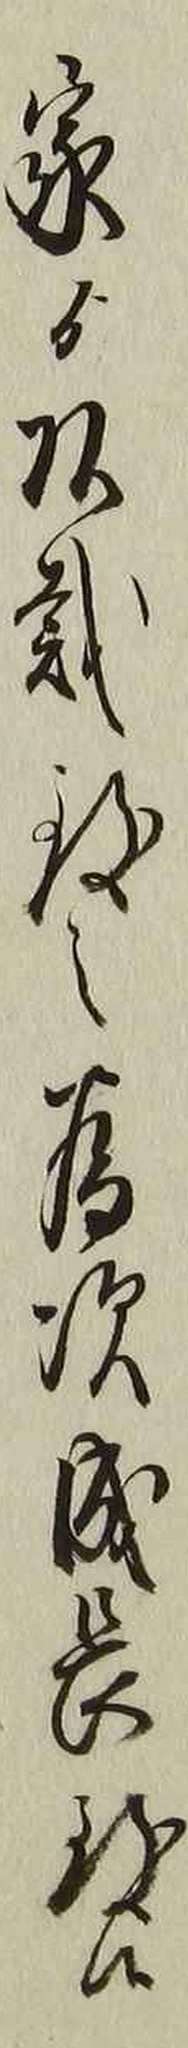家ゟ頂戴致之為次成長致候
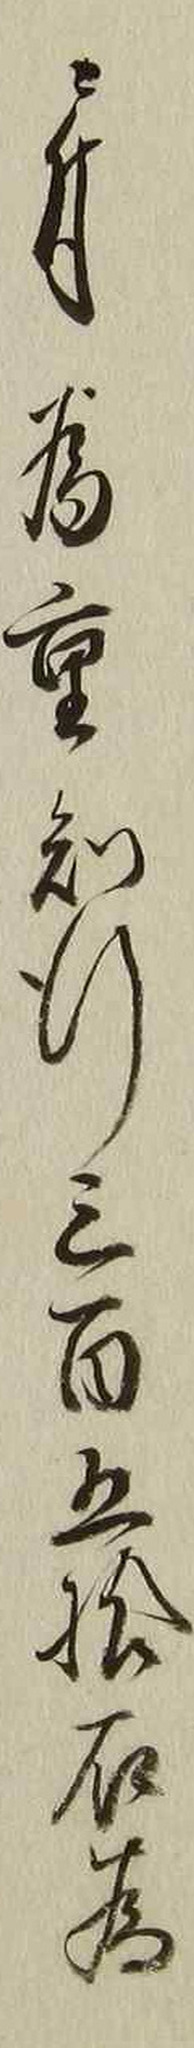ニ付為重知行三百五拾石為
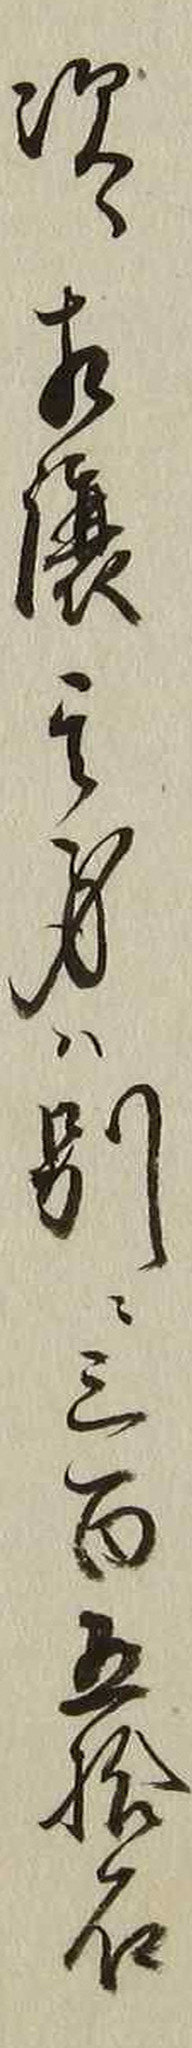次へ相譲其身ハ別ニ三百五拾石
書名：諸士系譜　巻之18　い之部18
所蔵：会津若松市立会津図書館
